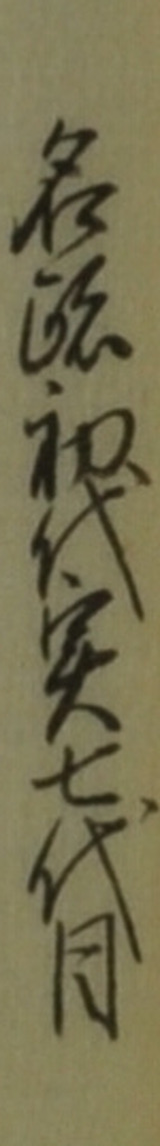名跡初代実七代目
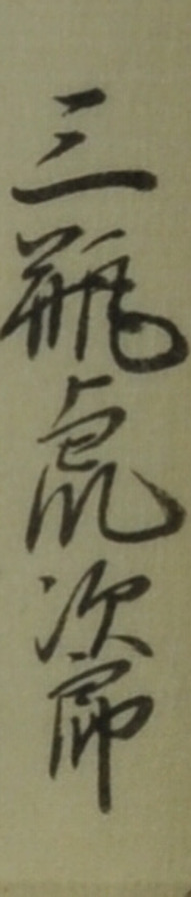三瓶虎次郎
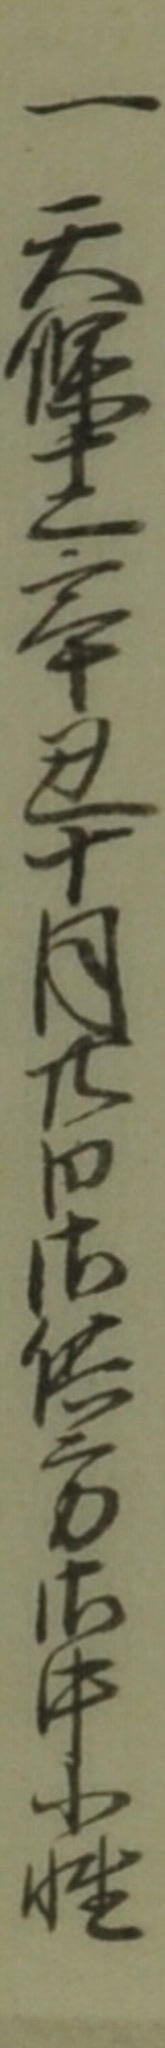一天保十二辛丑十月廿日御供方御中小性
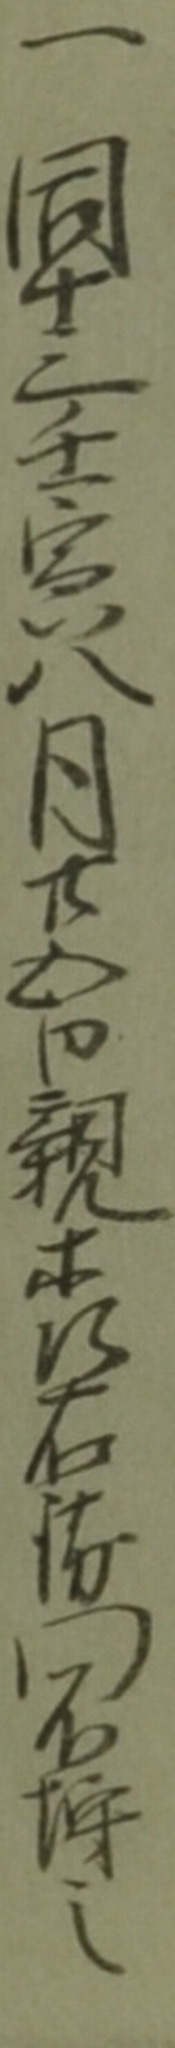一同十三壬寅八月廿五日親森右衛門不埒之
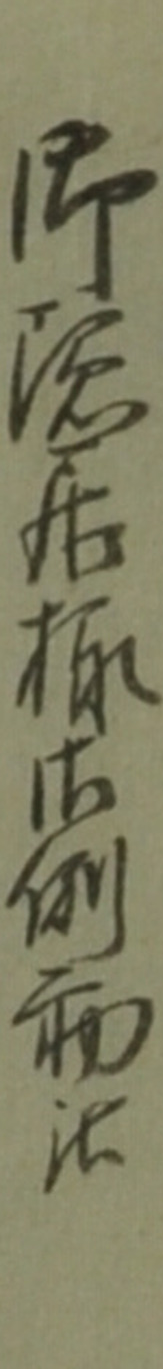御隠居様御側無滞
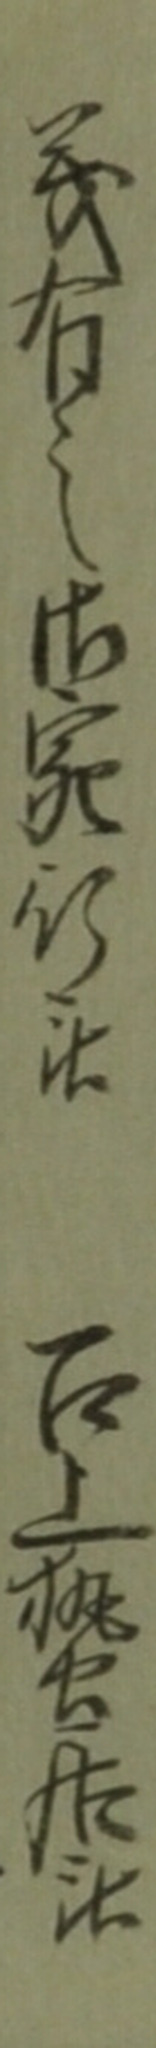義有之御宛行被召上蟄居被
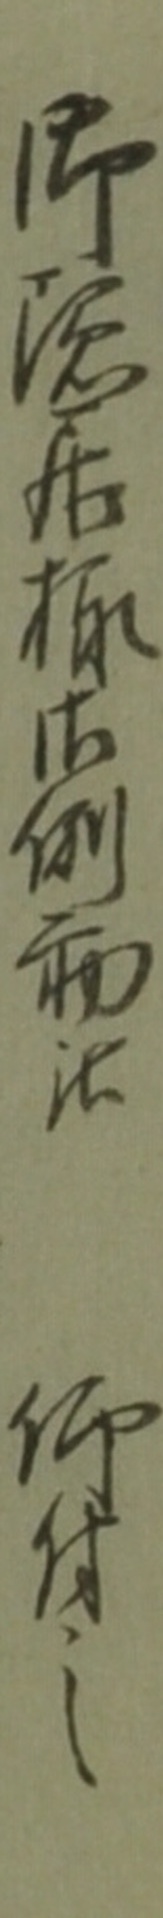御隠居様御側勤被仰付之
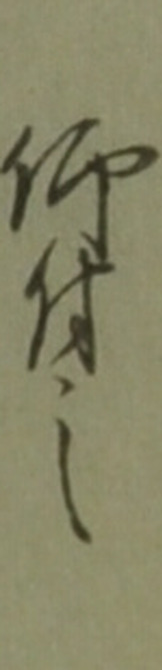仰付之
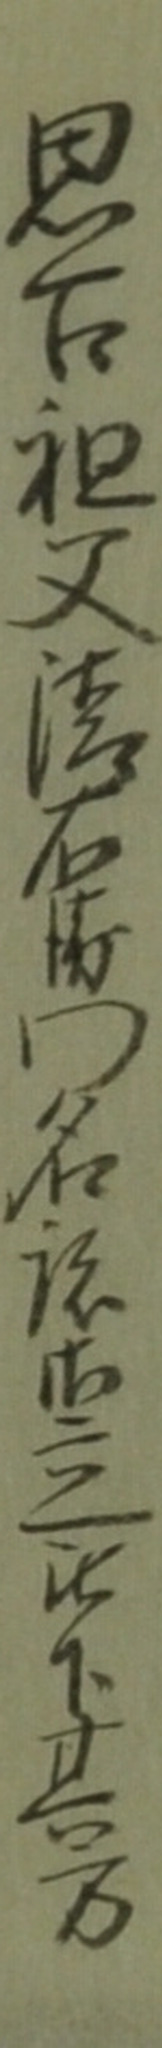思召祖父清右衛門名跡御立被下其方
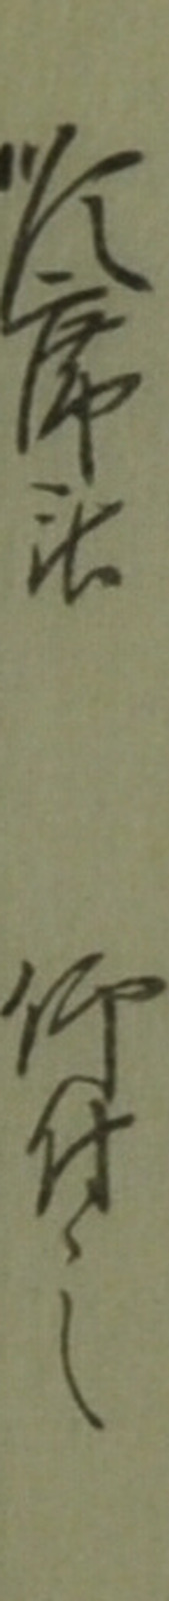順席被仰付之
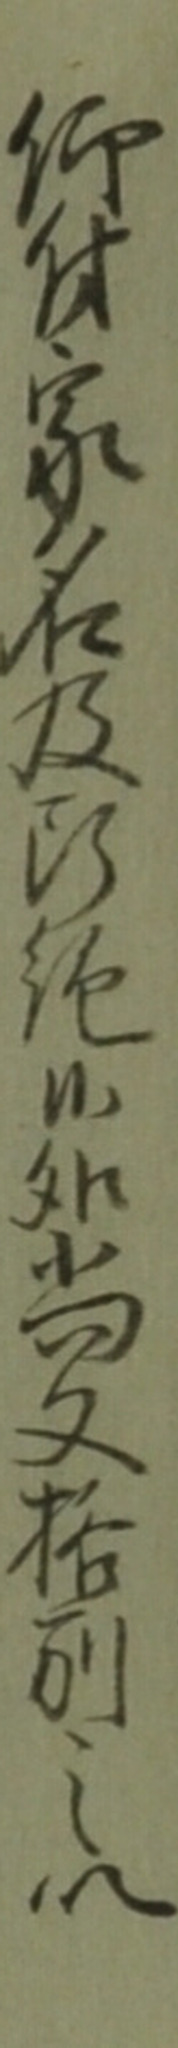仰付家名及断絶候処尚又格別之以
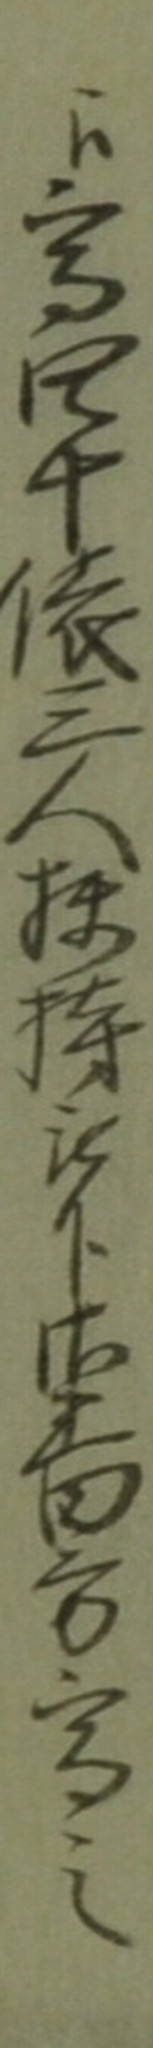江高四十俵三人扶持被下御番方高之
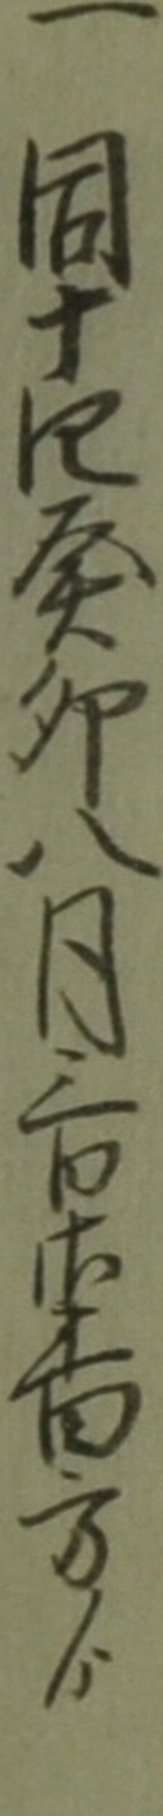一同十四癸卯八月三日御番方ゟ
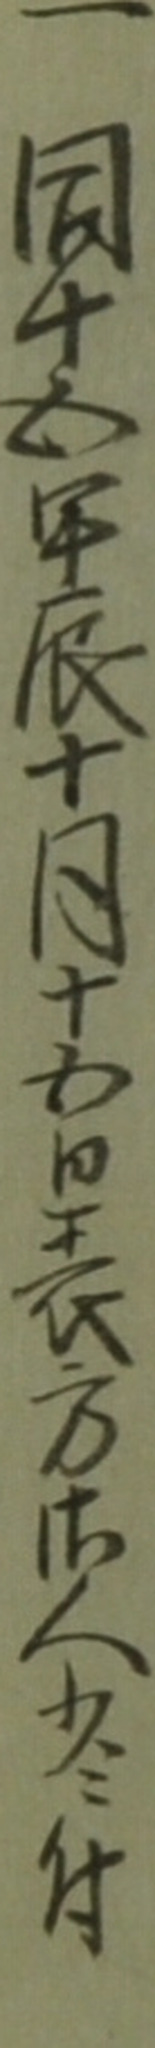一同十五甲辰十月十五日表方御人少ニ付
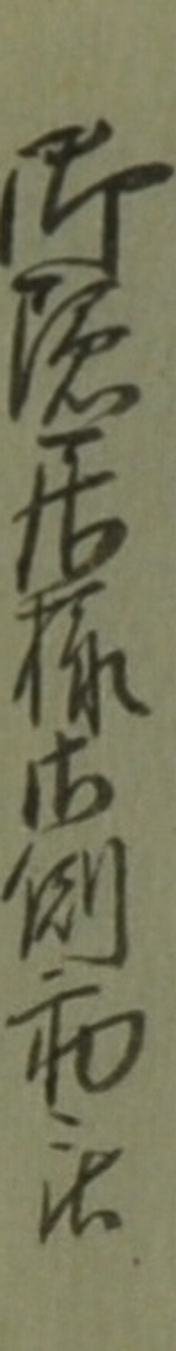御隠居様御側勤被仰付之
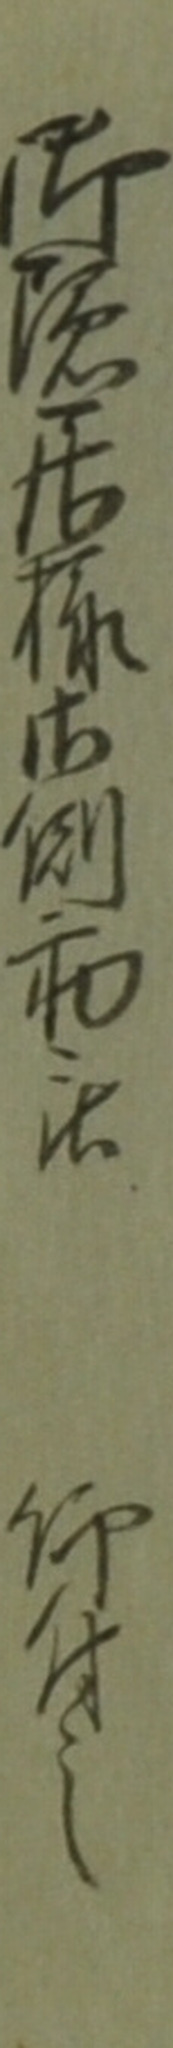御隠居様御側勤被仰付之
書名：諸御役代々録（五）
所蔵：伊那市立高遠町図書館・合同会社AMANE
